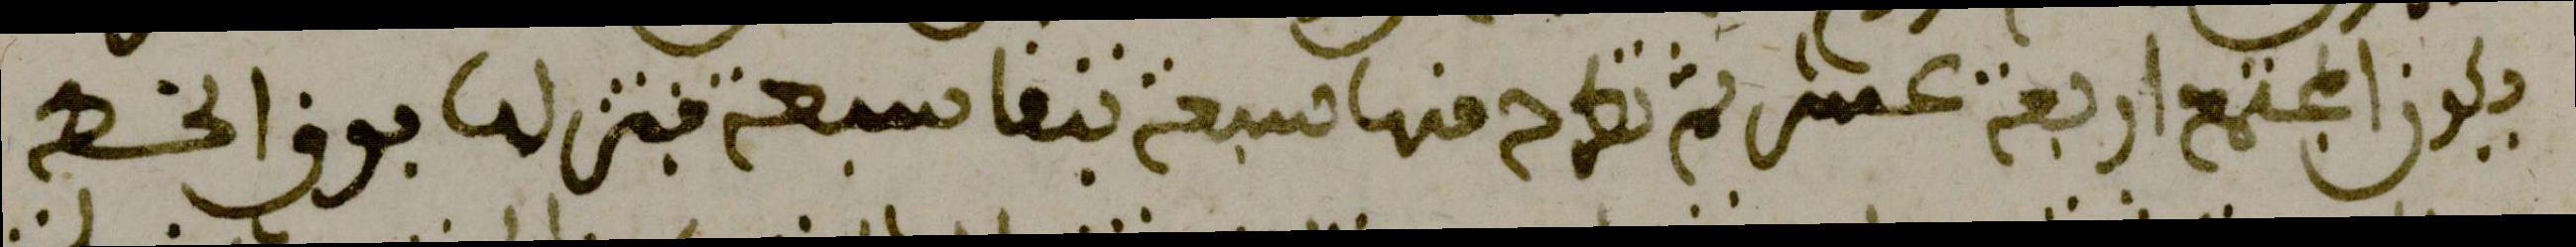يكون المجتمع اربعة عشر ثم تطرح منها سبعة تبقا سبعة فتنزلها فوق الخط
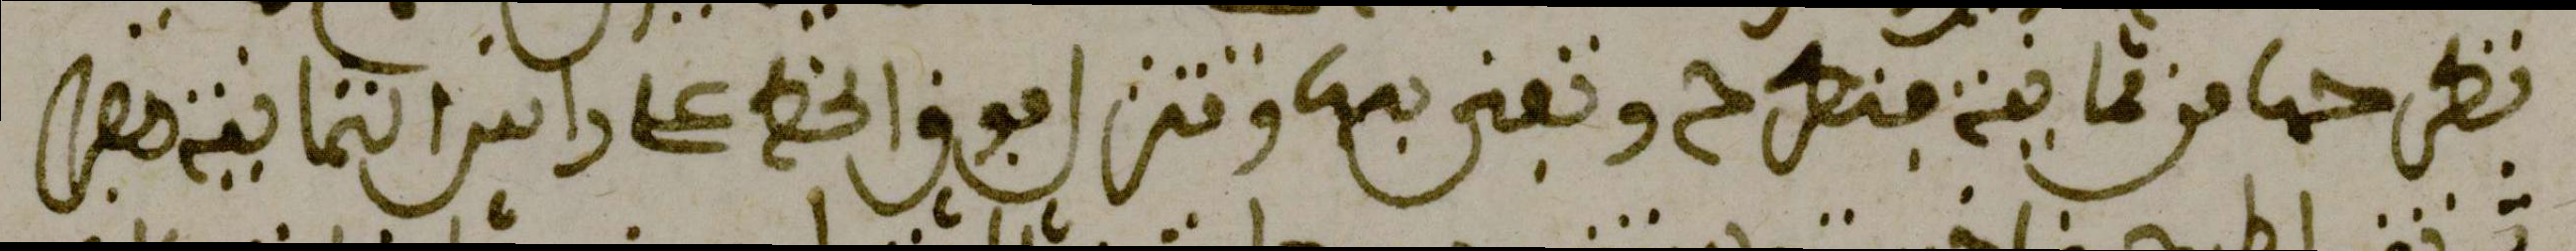تطرحها من ثمانية فنطرح وتفنى بها وتنزل فوق الخط على راس الثمانية صفرا
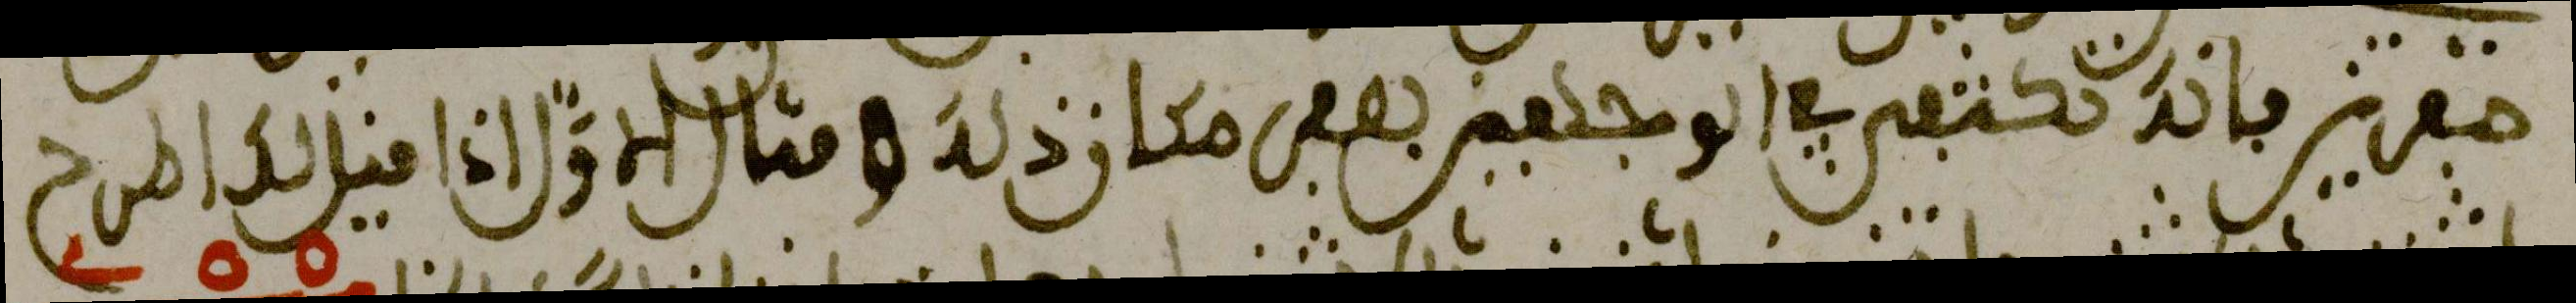صفرين فانك تكتفى في الوجهين بصفر مكان ذلك ومثال الاوّل اذا قيل لك اطرح
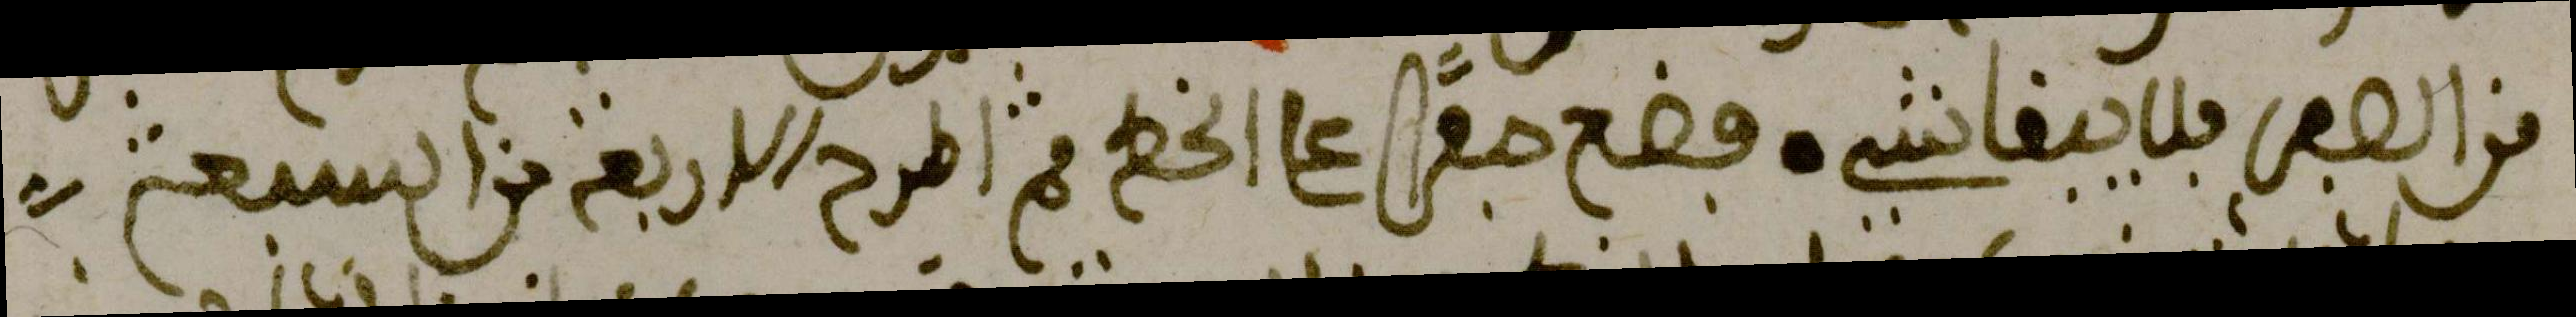من الصفر فلا يبقا شيء فضع صفرًا على الخط ثم اطرح الأربعة من السبعة
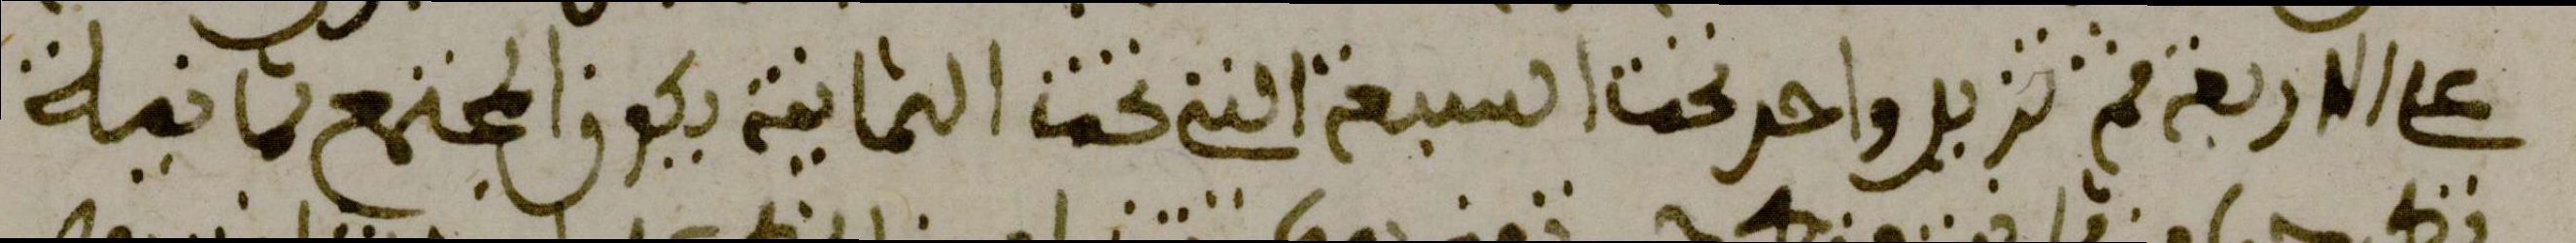على الاربعة ثم تزيل واحد تحت السبعة التي تحت الثمانية يكون المجتمع ثمانية
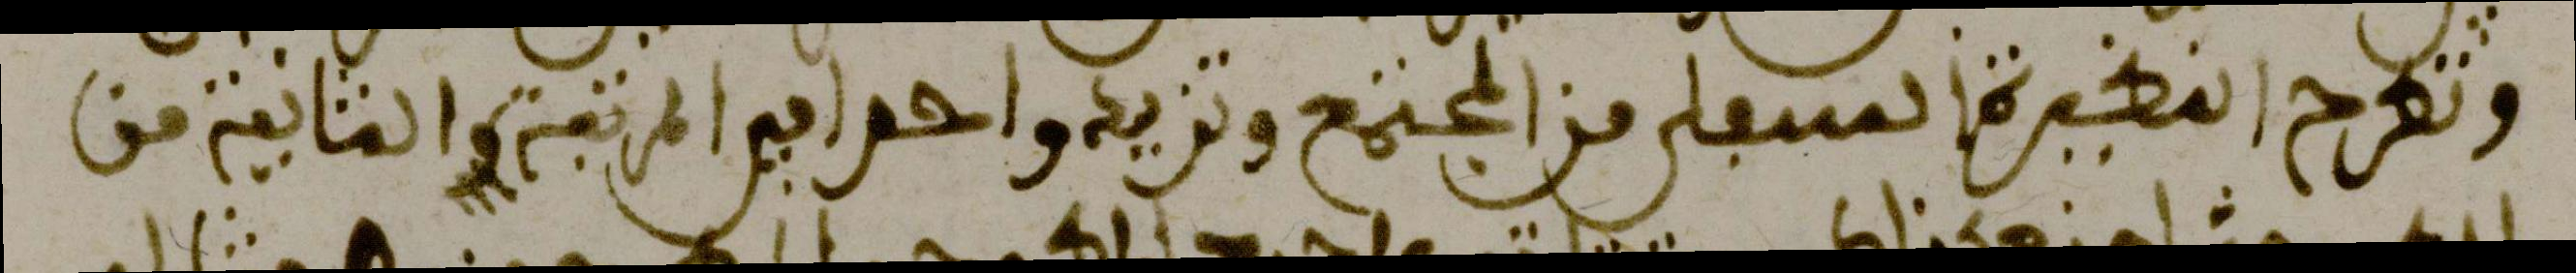وتطرح النظيرة السفلى من المجتمع وتزيد واحدا في المرتبة والثانية من
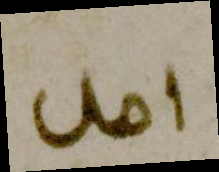اصل
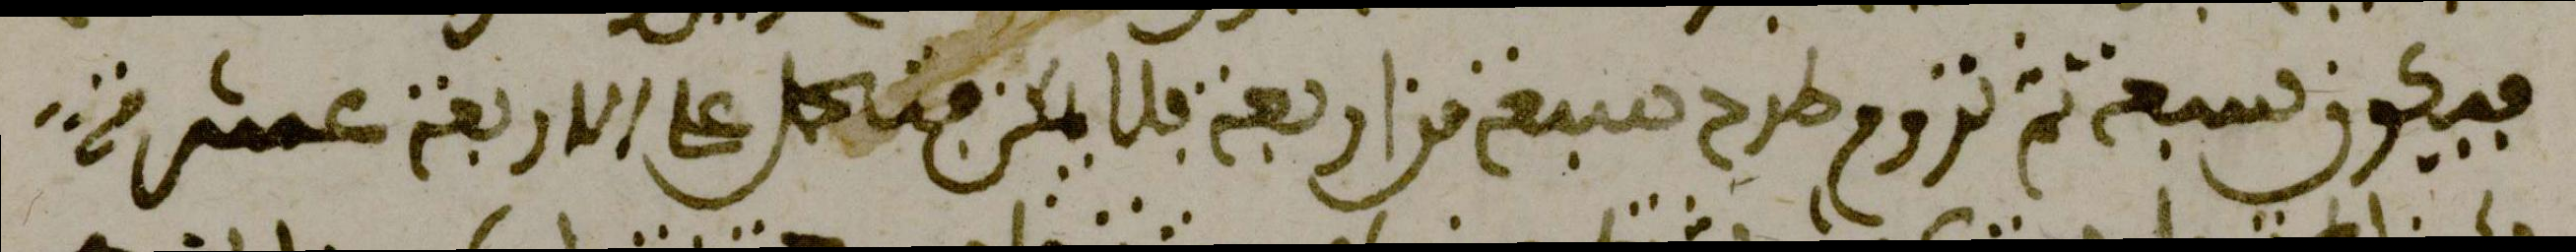فيكون سبعة ثم تروم طرح سبعة من اربعة فلا يمكن فتحمل على الاربعة عشرة
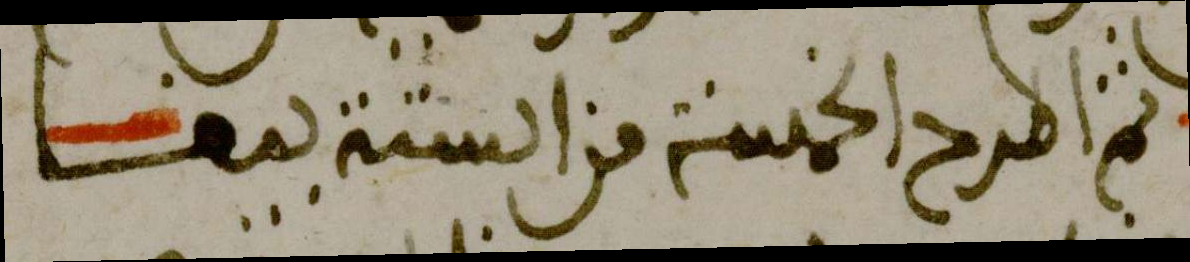ثم طرح الخمسة من الستة يبقا
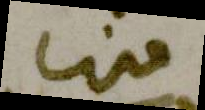منها
